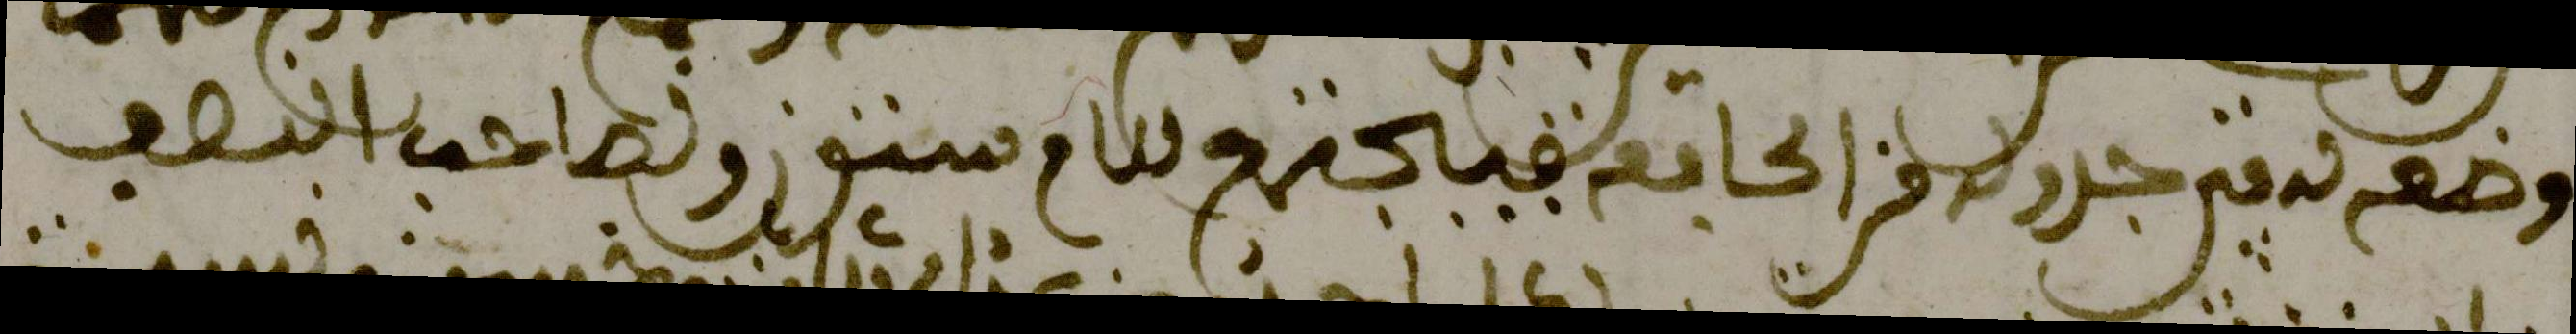وضعه له في جدول من الجامعة فيجتمع للام ستون ولصاحب النصف
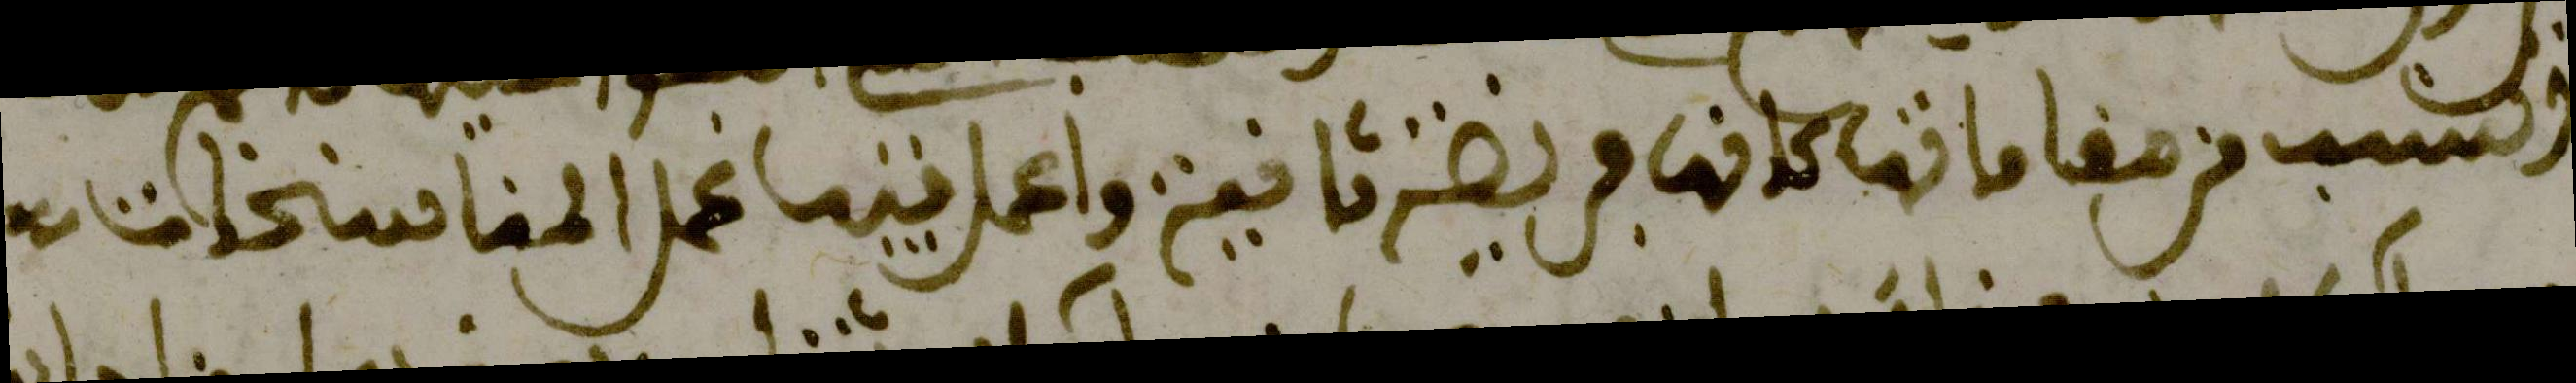النسب من مقاماتها كانها فريضة واعمل ثانية واعمل فيها عمل المناسخات
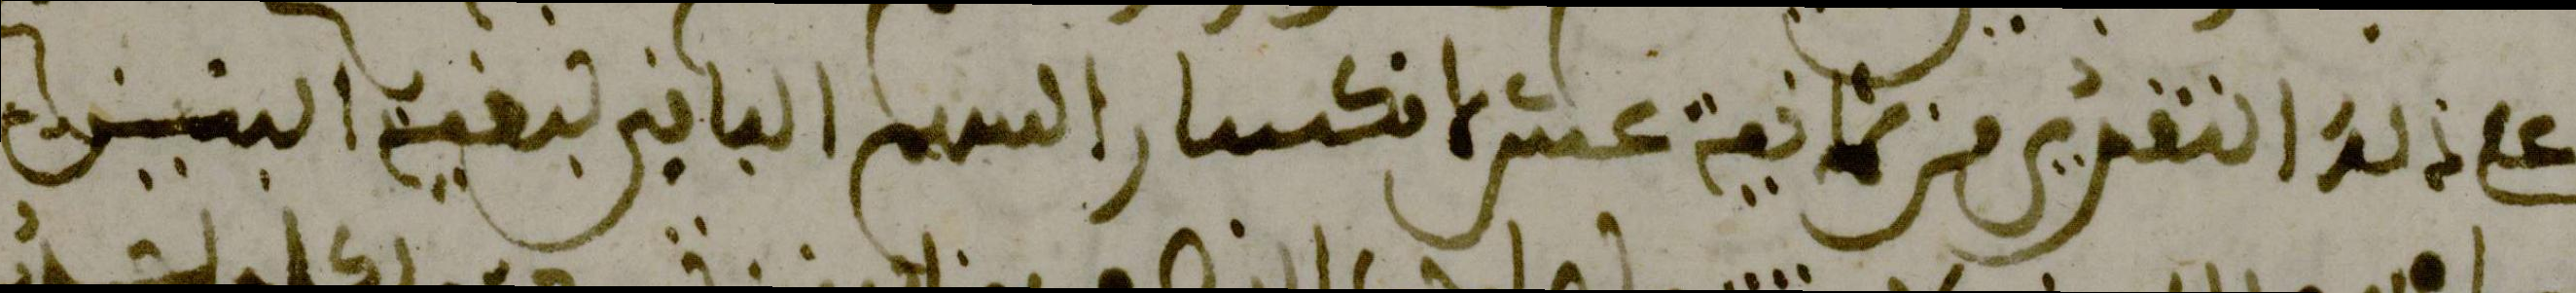على ذلك التقدير من ثمانية عشر لانكسار السهم الباقي لبقية البنين
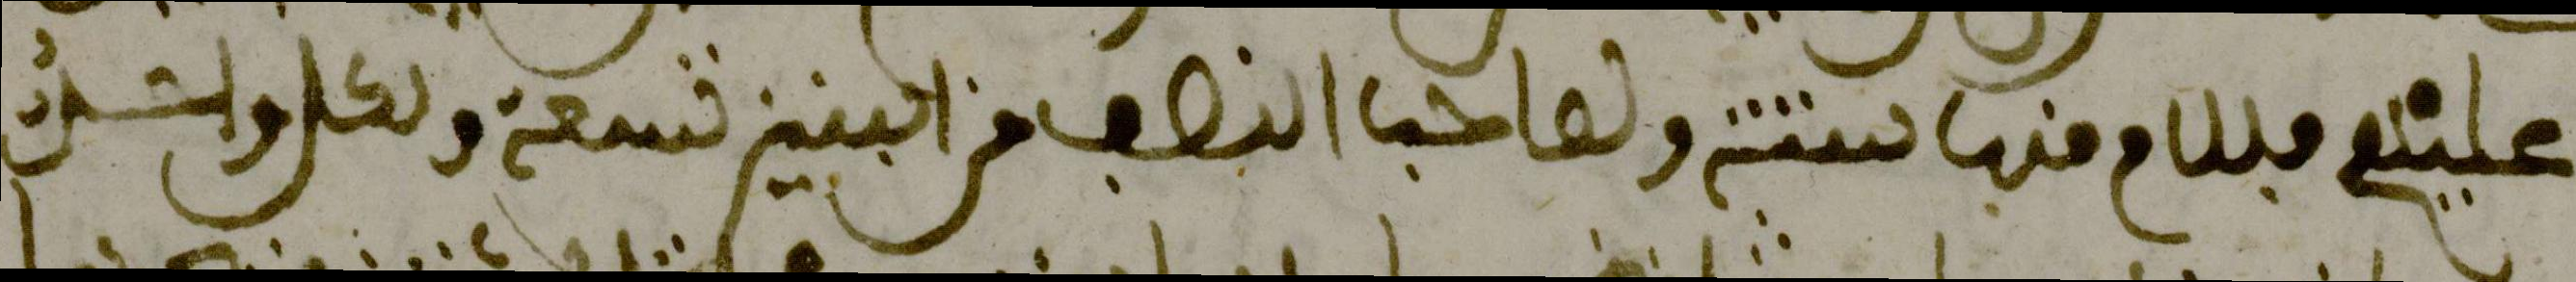عليْهم فللام منها ستة ولصاحب النصف من البنين تسعة ولكل واحد
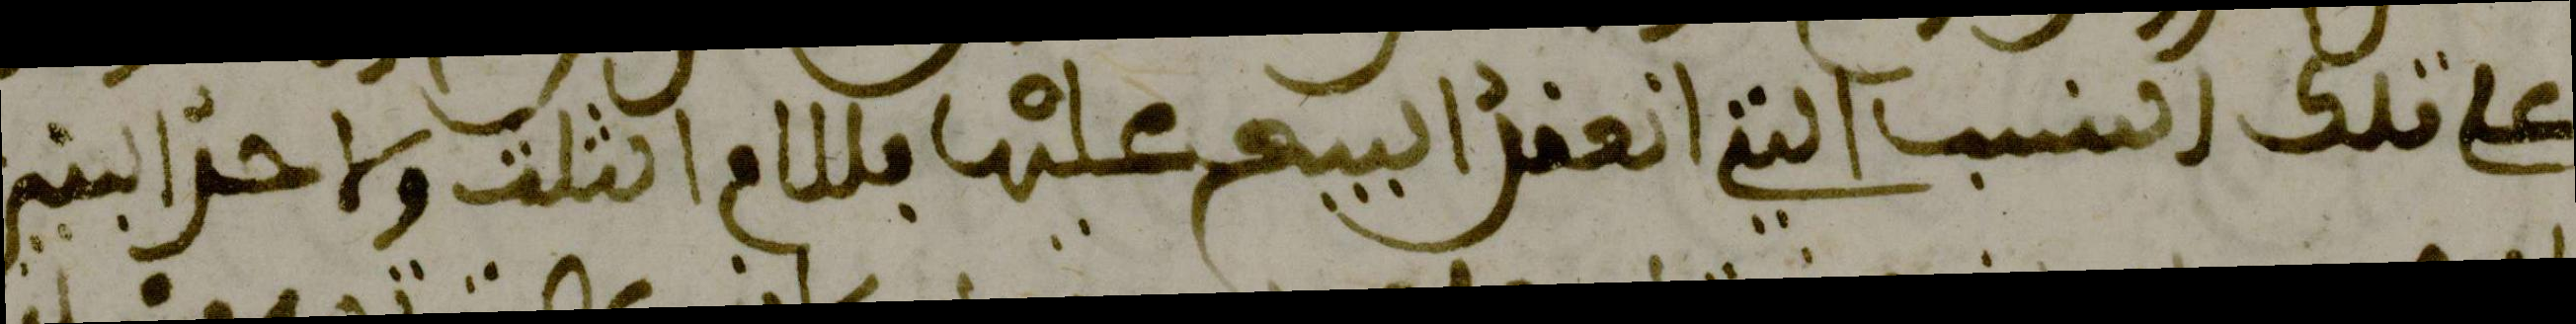على تلك النسب التي انعقد البيع عليْها فللام الثلث ولاحد البنين
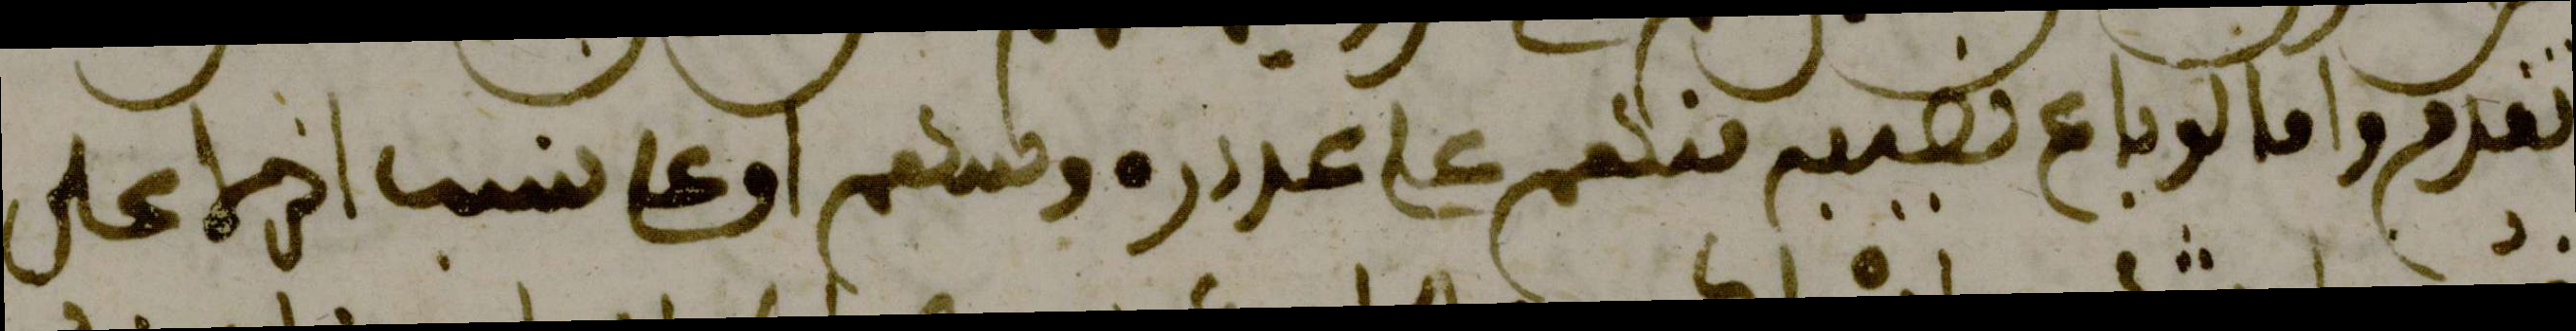تقدم واما الوباع نصيبه منهم على عدد رءوسهم او على نسب اخر لاعلى
